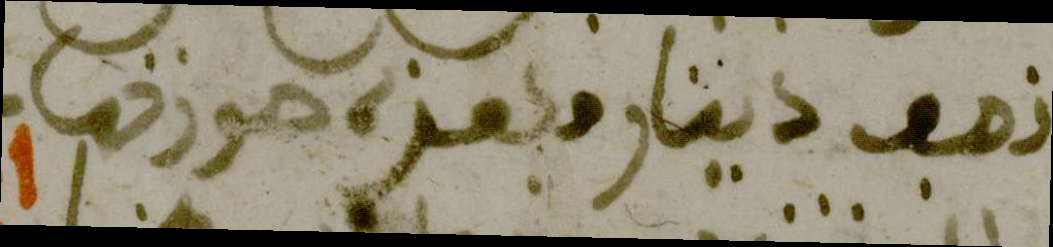نصف دينار فهذه صورتها
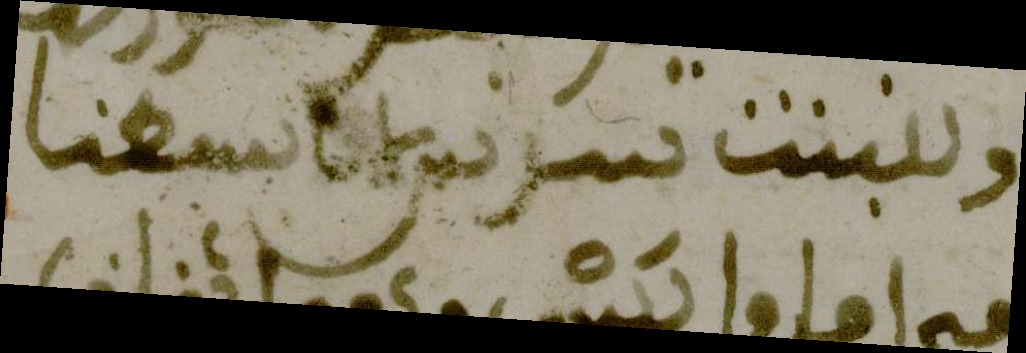وللبنت سدس لانا بسطنا
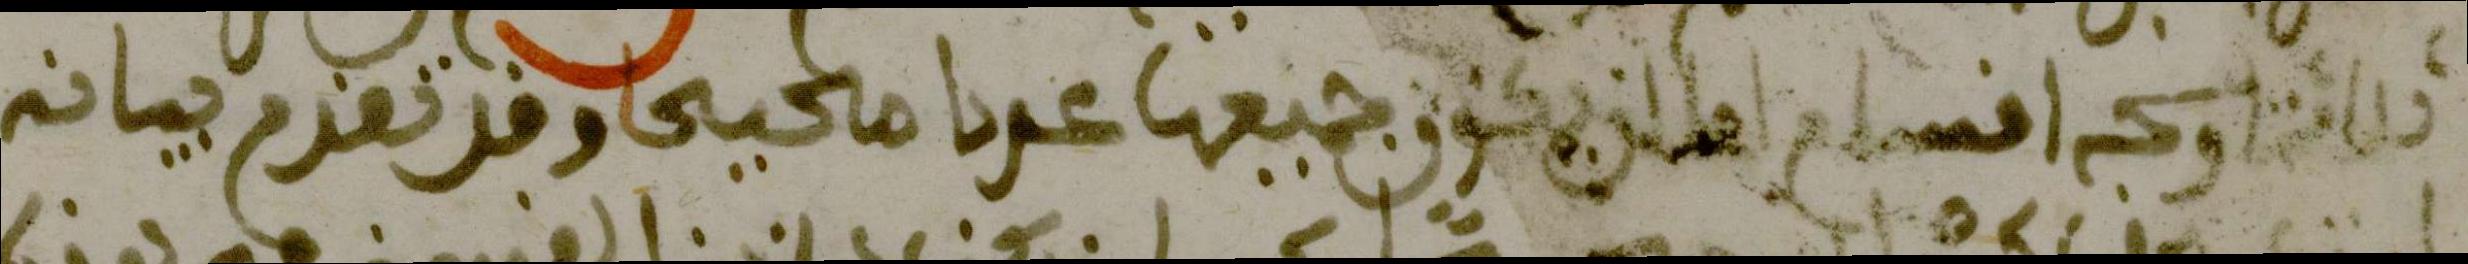ثلاثت وبه اقسام اما ان يكون جميعها عددا صحيحا وقد تقدم بيانه
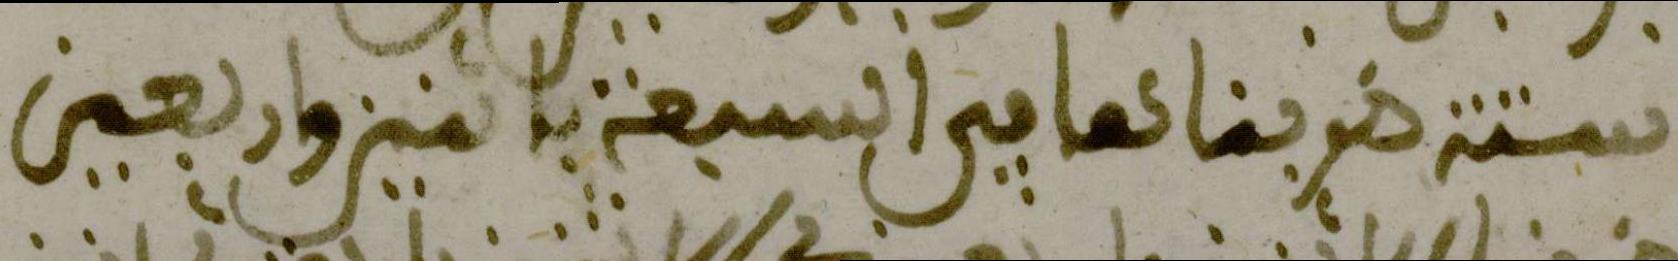ستة ضربناها في السبة باثنين واربعين
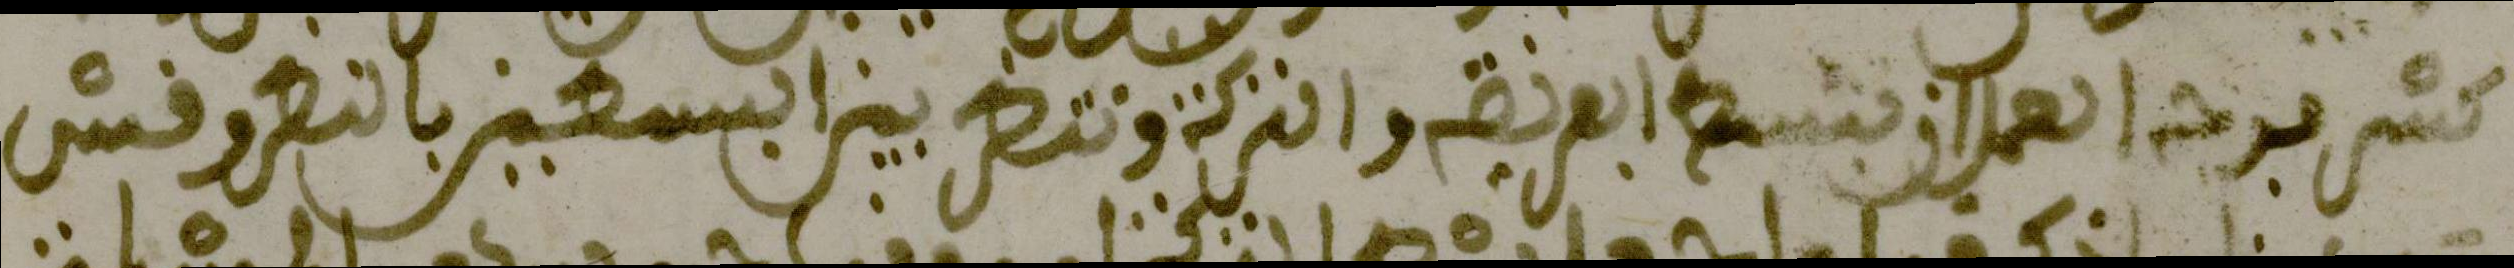كسْر فوجه العمل ان تبسط الفريضة التركة وتنظر بين البسطين بالنظر وقسْ
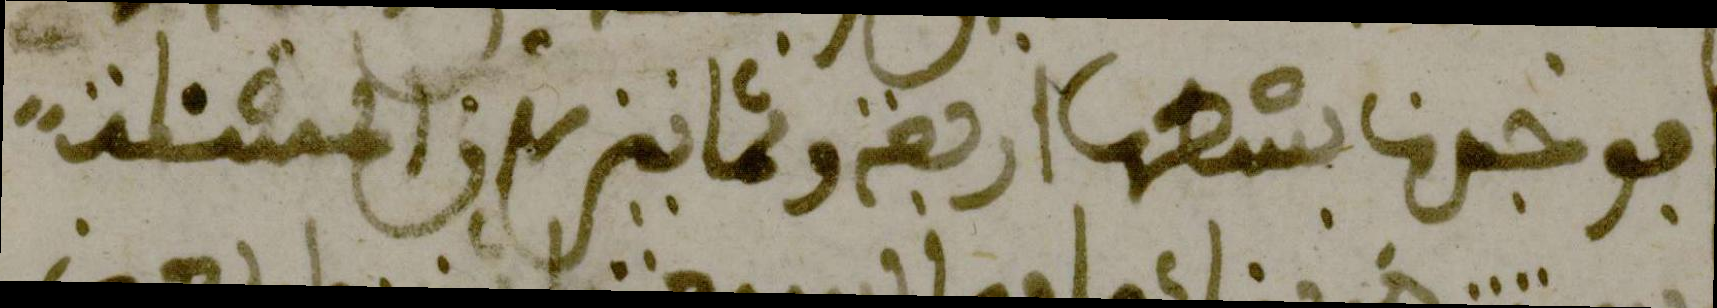فوجدن بسْطها اربعة وثمانين لان المسْئلة
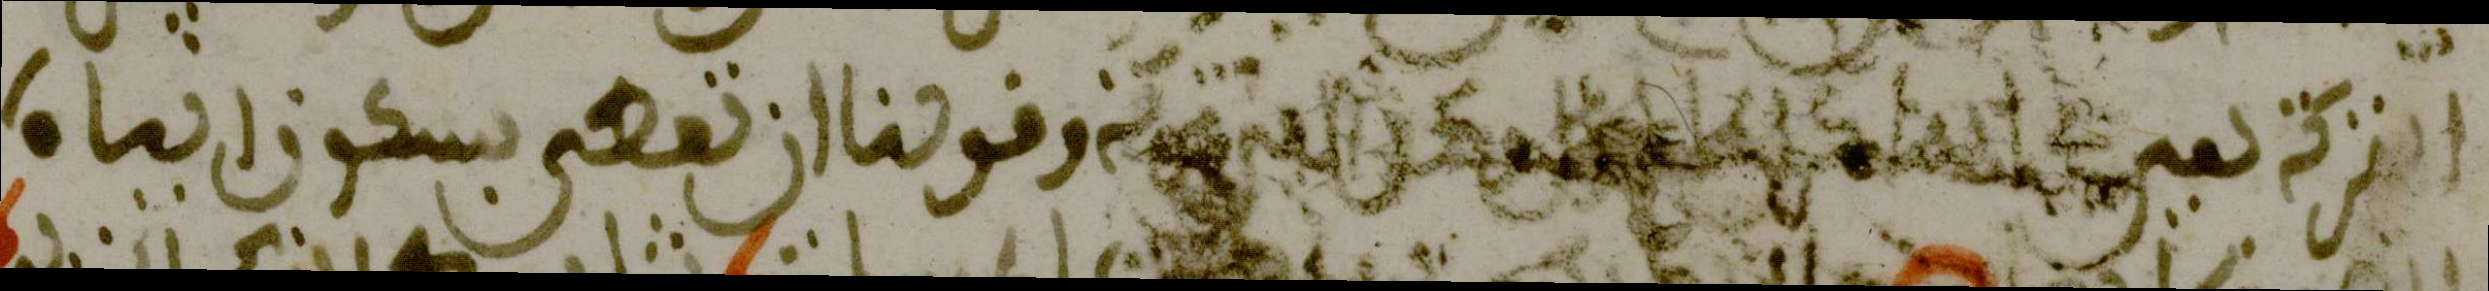التركة هي في الشكل كالاول وكذا في تركة وقولنا ان تعطى بسكون الياء
